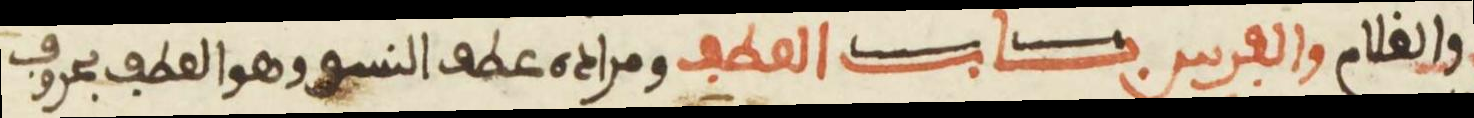و الغلام و الفرس باب العطف و مراده عطف النسق و هو العطف بحروف
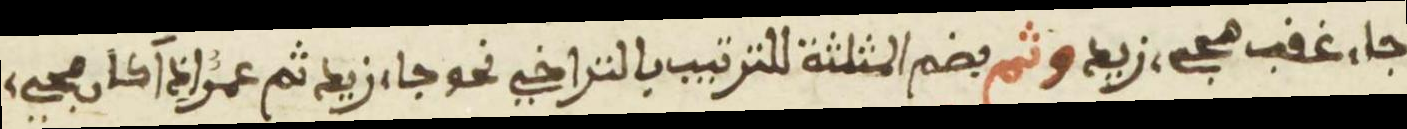جاء غقب مجىء زيد و ثم بضم المثلثة للترتيب بالتراخي نحو جاء زيد ثم عمر اذا كان مجىء
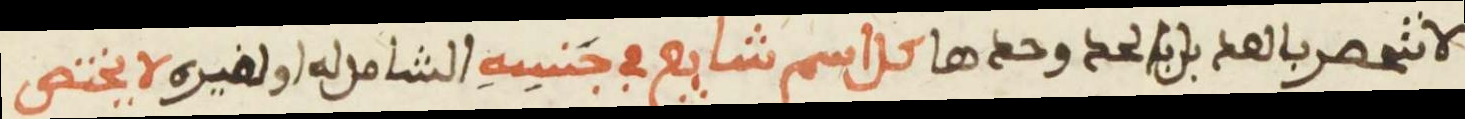لا تنحصر بالعد ### لحد وحدها كل اسم شايع في جنسه الشامل له او لغيره لا يختص
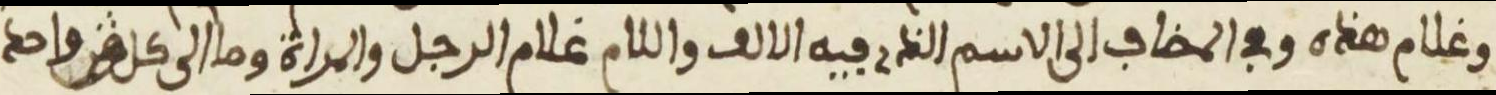و غلام هذه و في المضاف الى الاسم الذي فيه الالف و اللام غلام الرجل و المراة و ما الى كل ### واحد
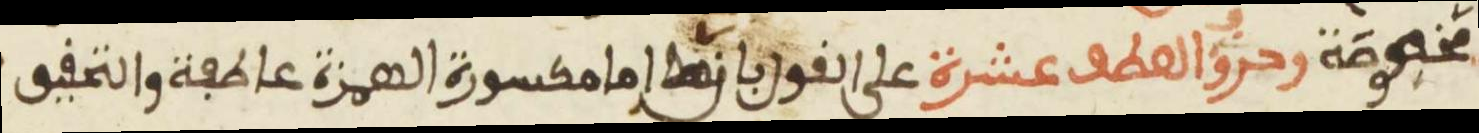مخصوصة و حرو العطف عشرة على القول بانها اما مكسورة الهمزة عاطفة و التحقيق
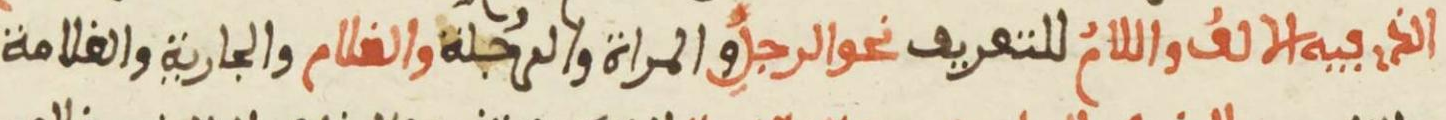الذي فيه الالف و اللام للتعريف نحو الرجل و المراة و الرجلة و الغلام و الجارية و الغلامة
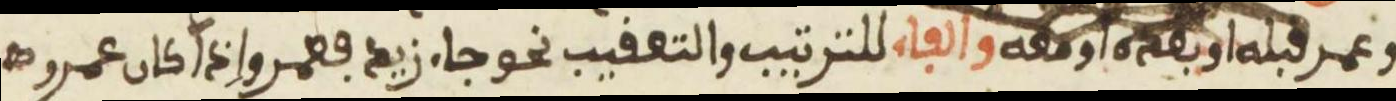و عمر قبله او بعده او معه و الفاء للترتيب و التعقيب نحو جاء زيد فعمر و اذا كان عمرو ###
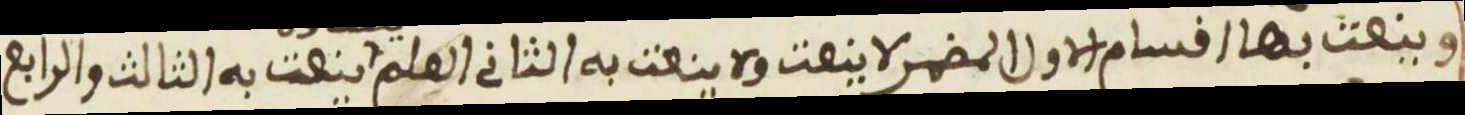و ينعت بها اقسام الاول المضمر لا ينعت و لا ينعت به الثاني العلم ينعت به الثالث و الرابع
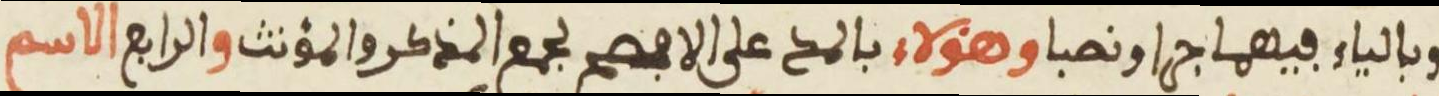و بالياء فيهما جرا و نصبا و هؤلاء بالمد على الافصح بجمع المذكر و المؤنث و الرابع الاسم
